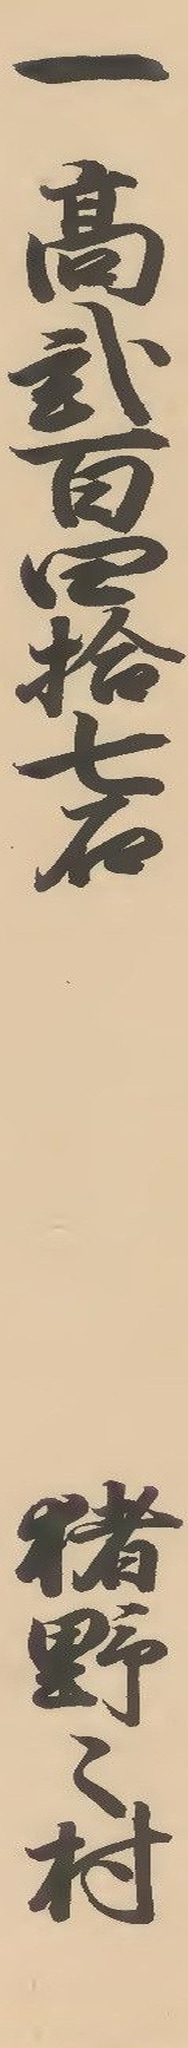一高弐百四拾七石猪野々村

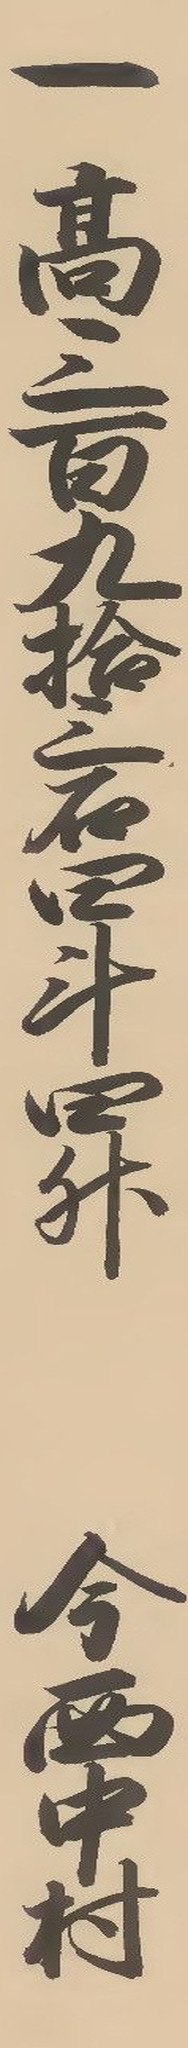一高三百九拾三石四斗四升今西中村
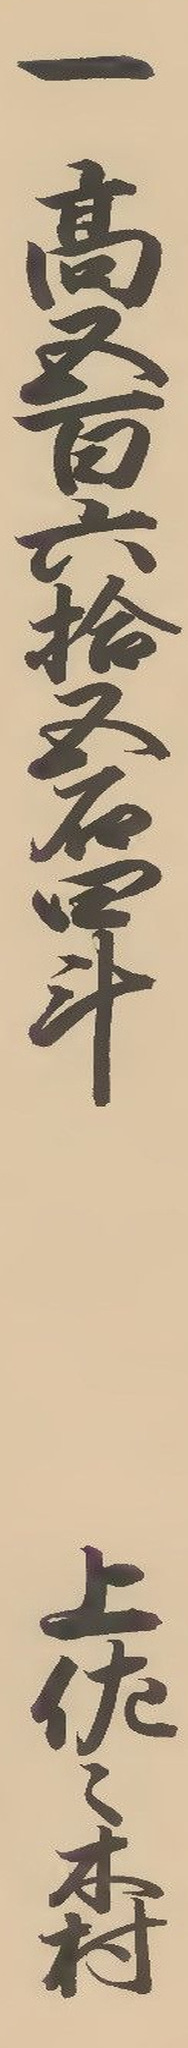一高五百六拾五石四斗上佐々木村

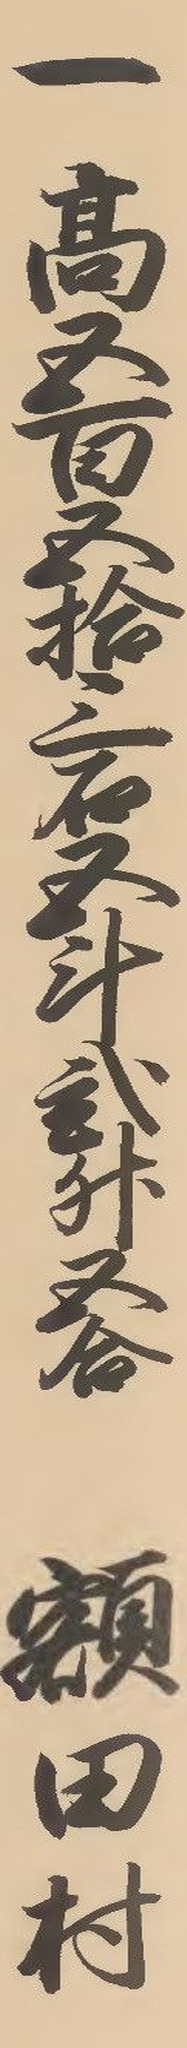一高五百五拾三石五斗弐升五合額田村
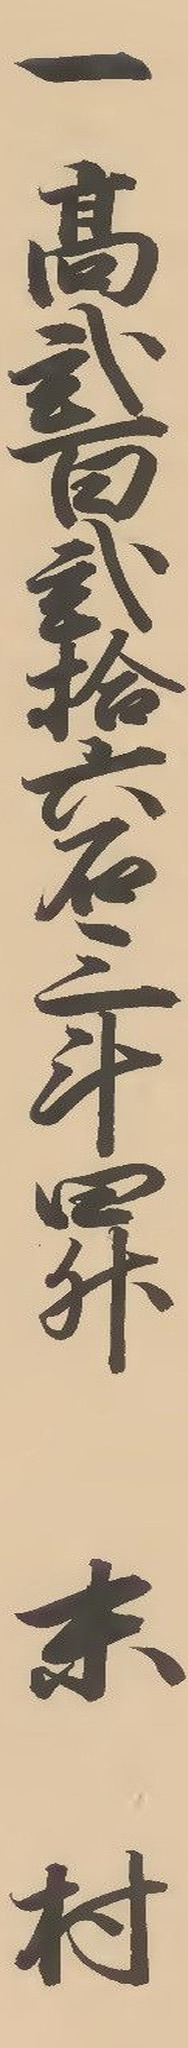一高弐百弐拾六石三斗四升末村
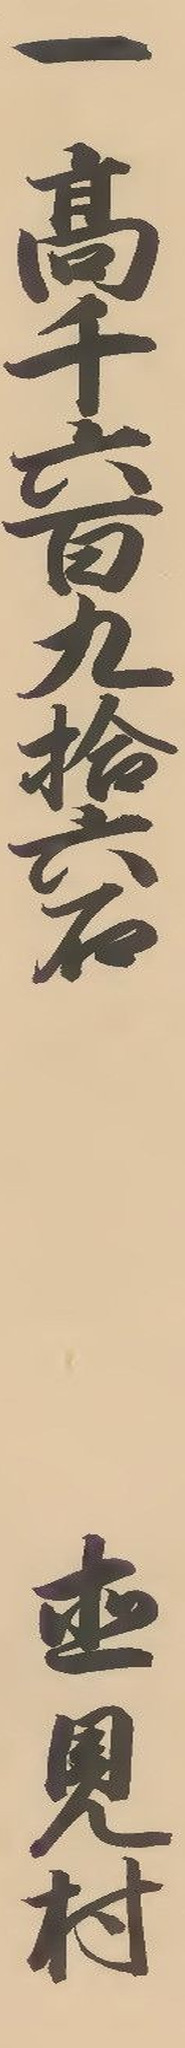一高千六百九拾六石直見村

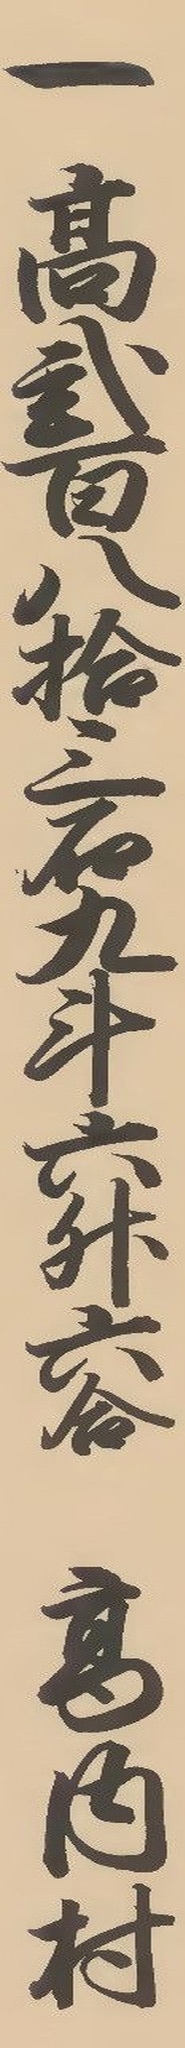一高弐百八拾三石九斗六升六合高内村
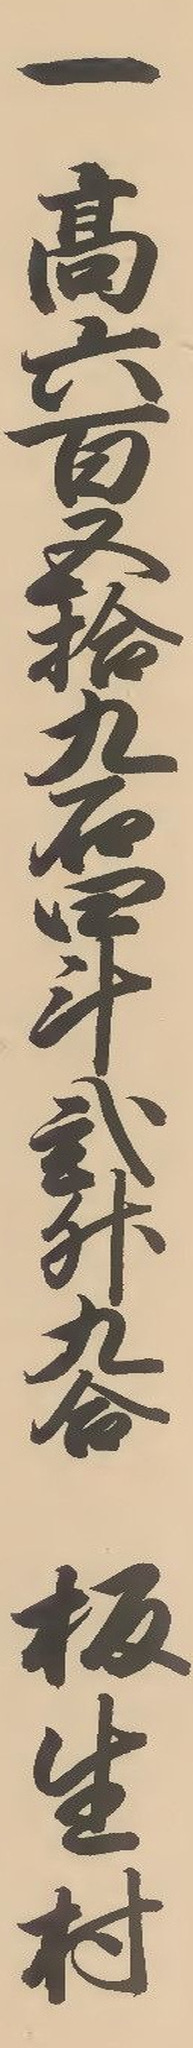一高六百五拾九石四斗弐升九合板生村
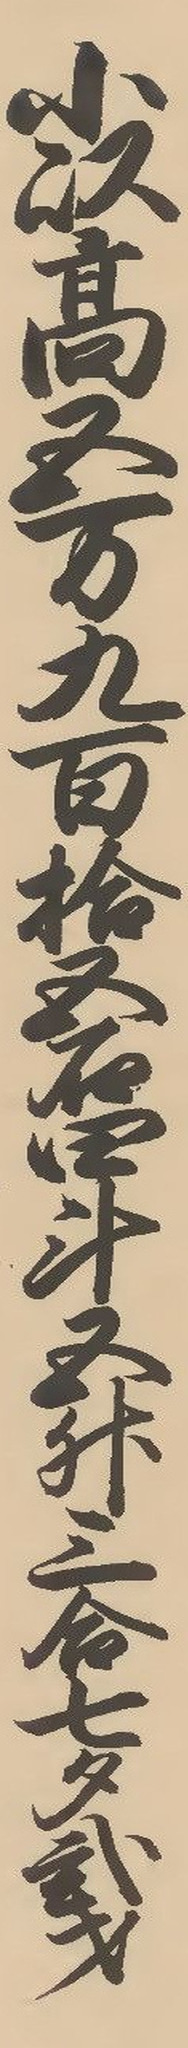小以高五万九百拾五石四斗五升三合七勺弐才

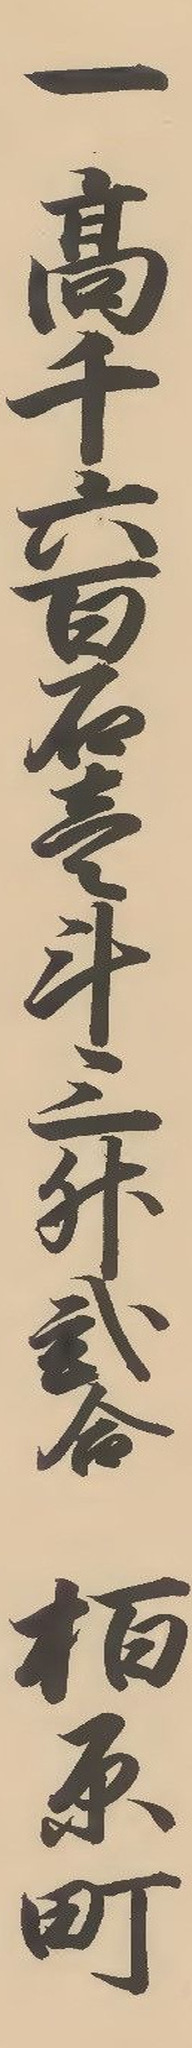一高千六百石壱斗三升弐合栢原町
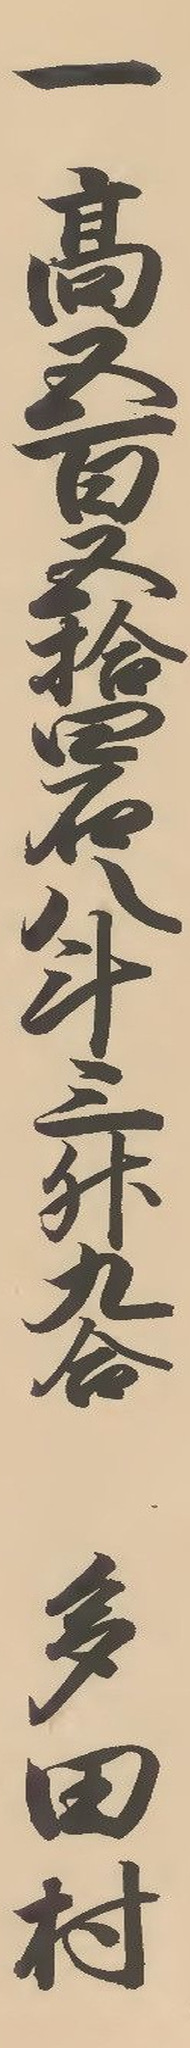一高五百五拾四石八斗三升九合多田村
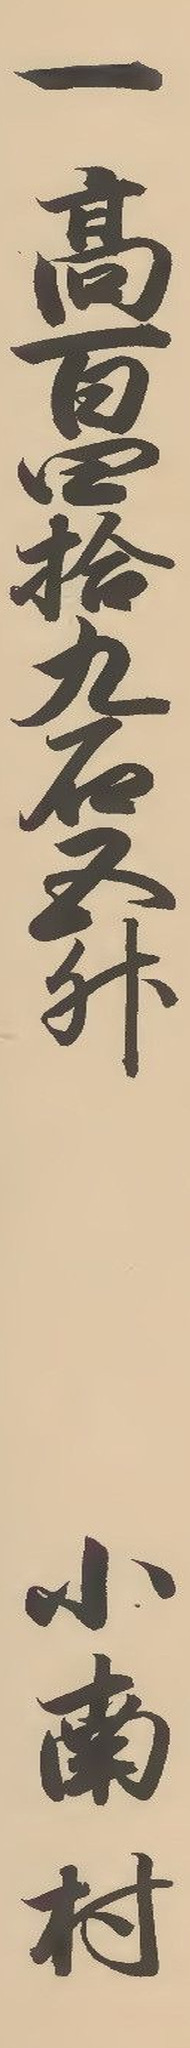一高百四拾九石五升小南村
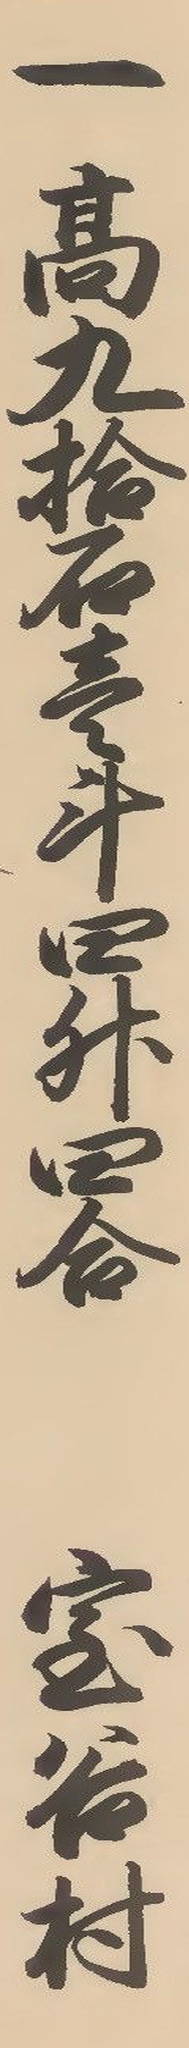一高九拾石壱斗四升四合室谷村
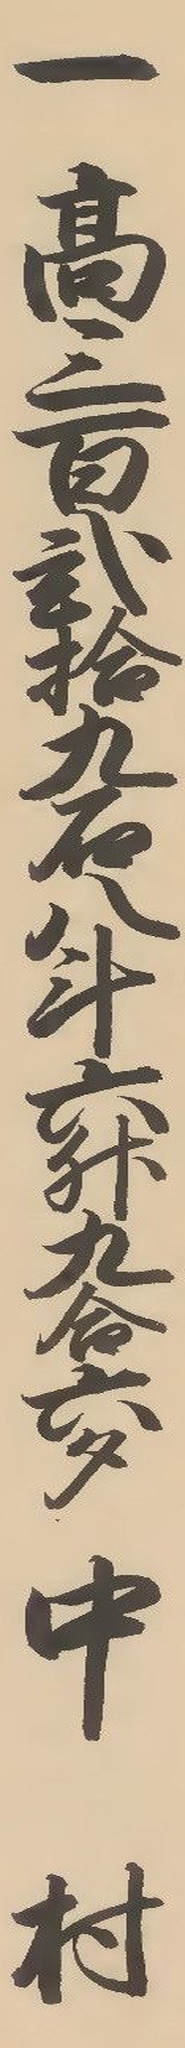一高三百弐拾九石八斗六升九合六勺中村
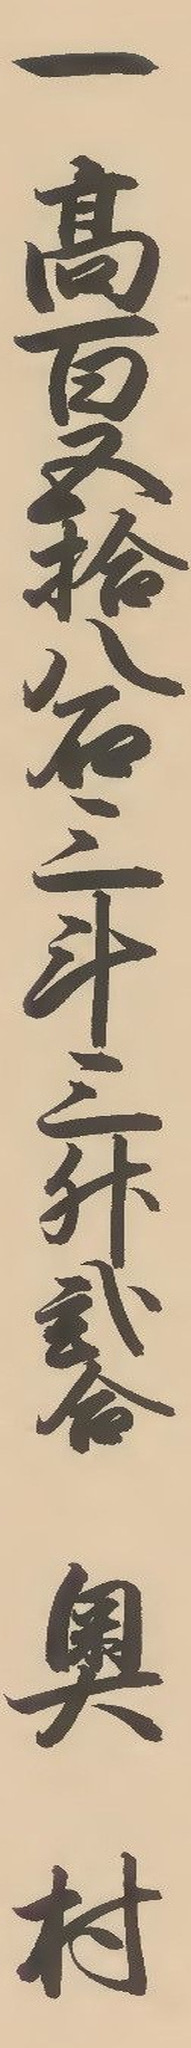一高百五拾八石三斗三升弐合奥村
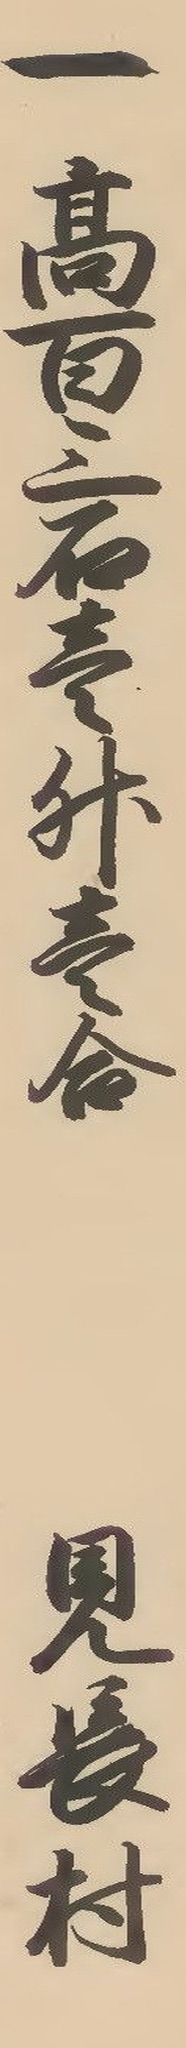一高百三石壱升壱合見長村
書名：丹波国郷帳
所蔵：国立公文書館 National Archives of Japan
